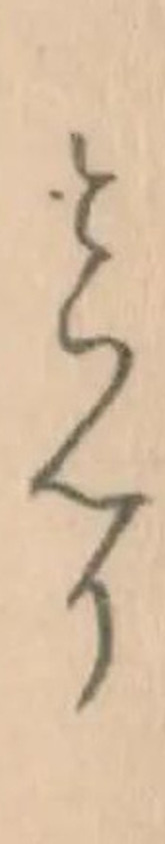といへり
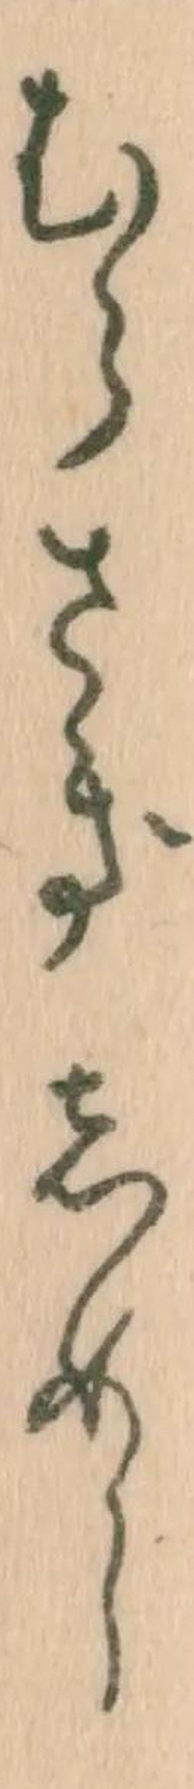むらさきしめし
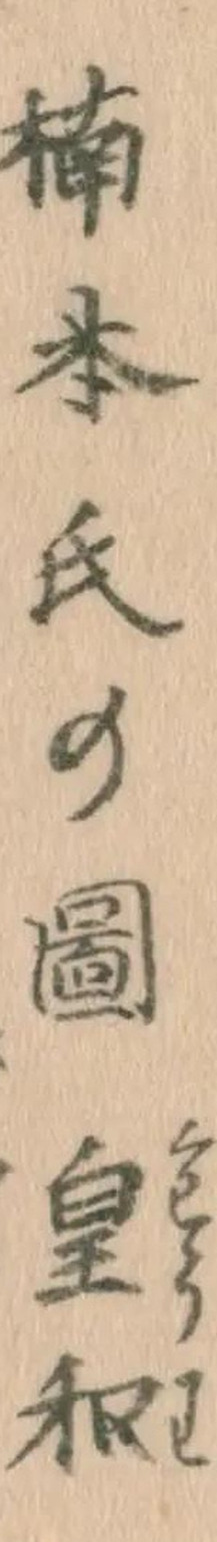楠本氏の図皇和
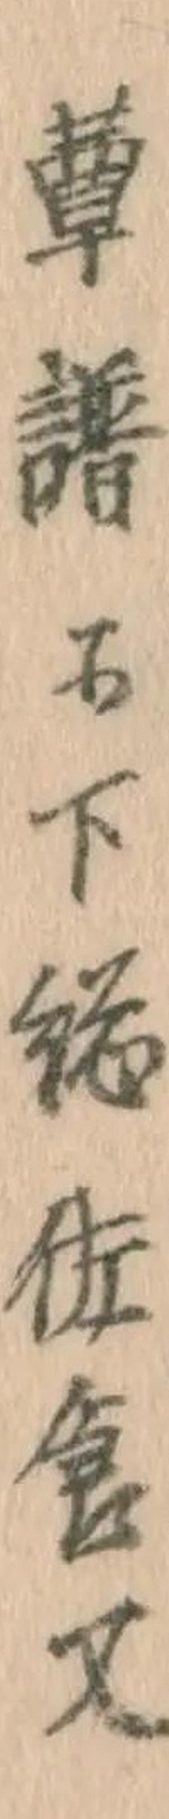蕈譜に下総佐倉又
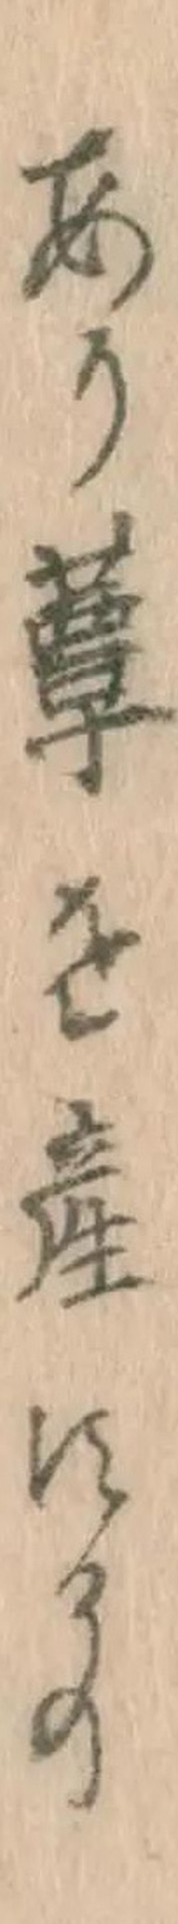あり蕈を産するの
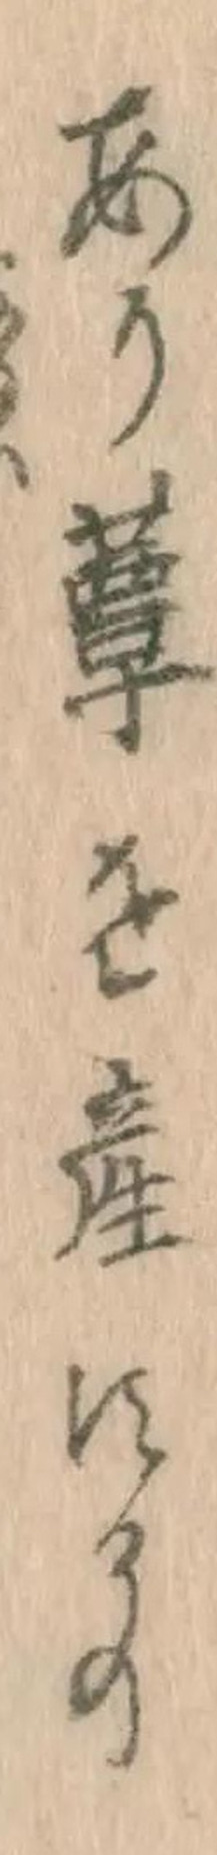あり蕈を産するの
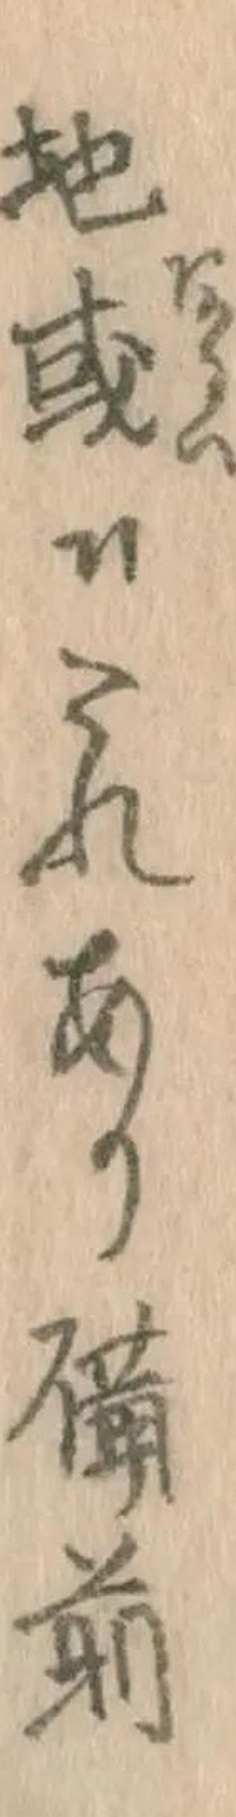地或はこれあり備前
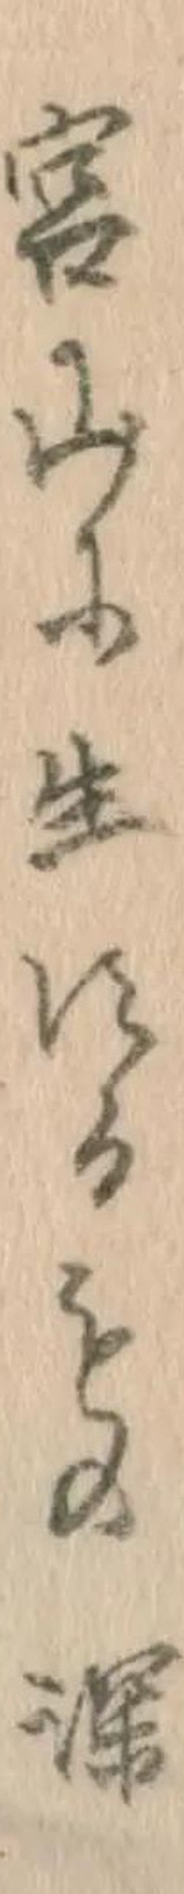宮山に生するもの深
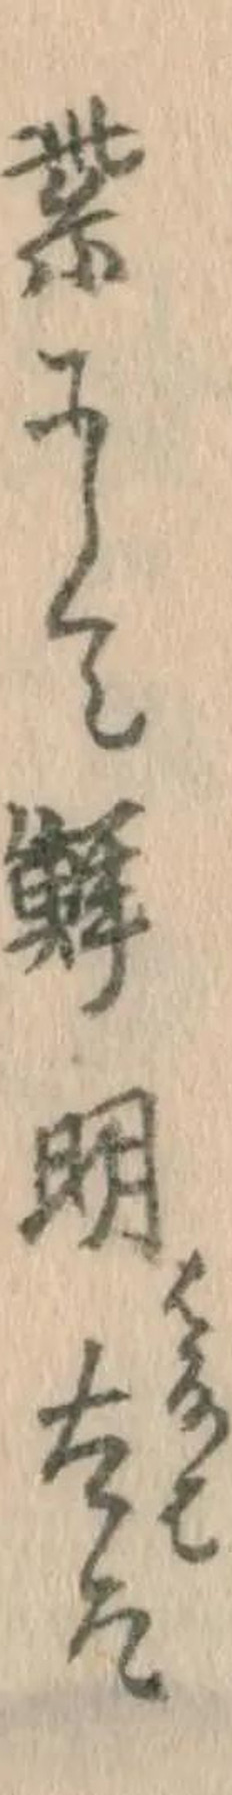紫にして鮮明太た
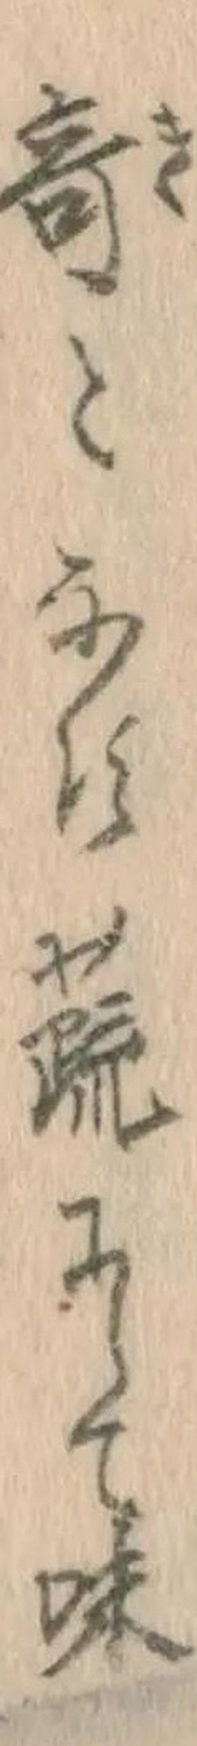奇となす蔬にして味

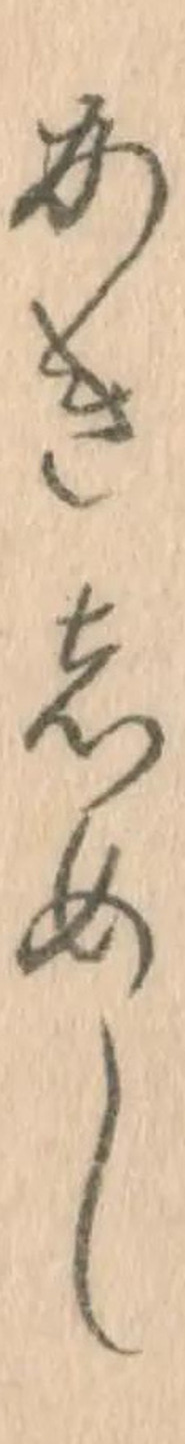かきしめし
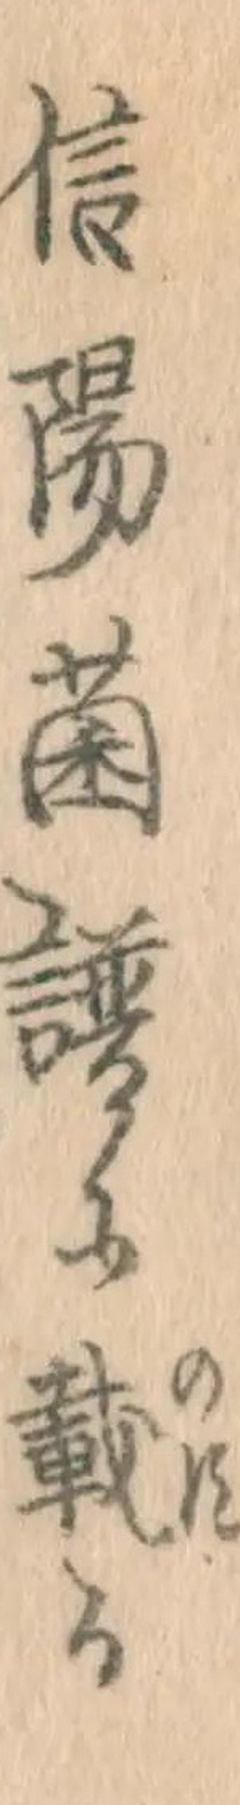信陽菌譜に載る
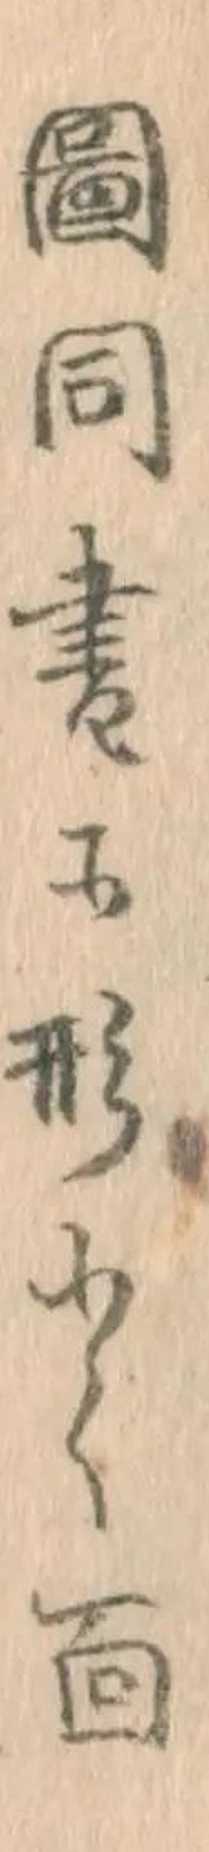図同書に形小く面
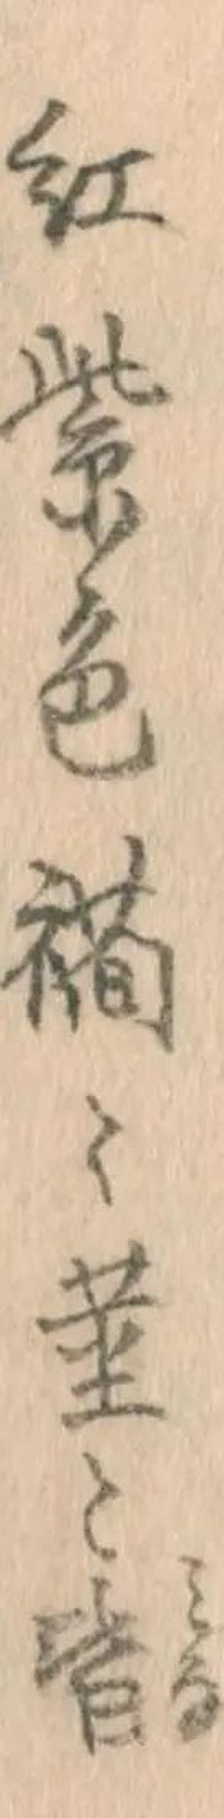紅紫色と茎と皆
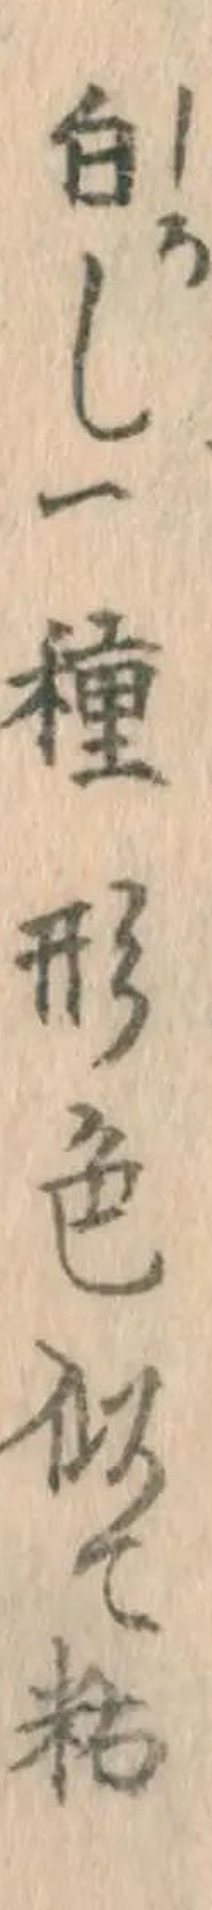白し一種形色似て粘
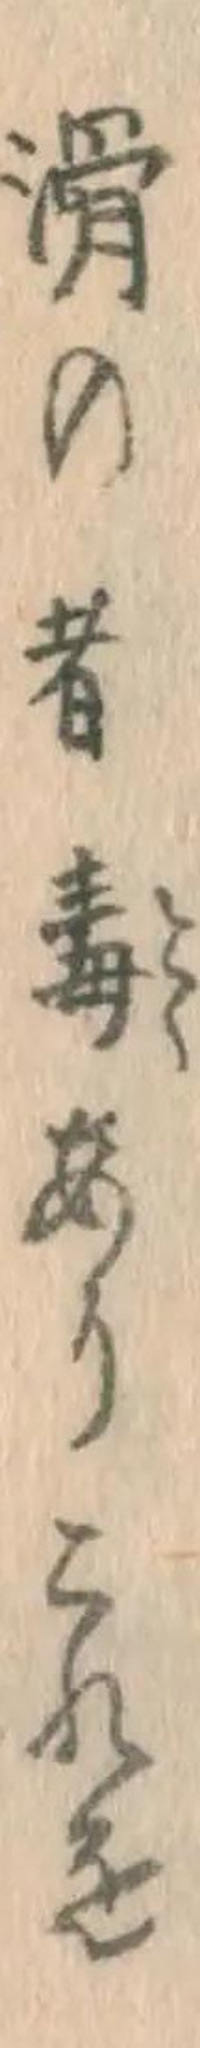滑の者毒ありこれを
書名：本草図譜. 巻55-57
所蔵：国立国会図書館 National Diet Library, JAPAN
